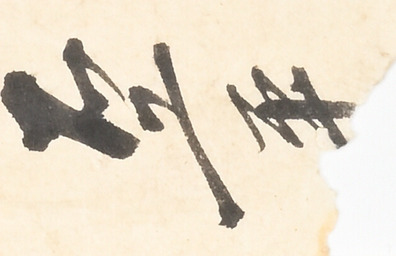石工平
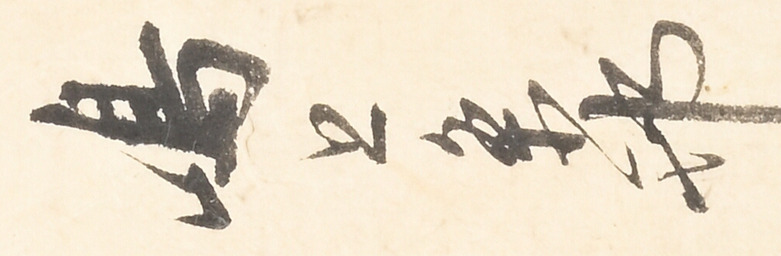嶋上条郡
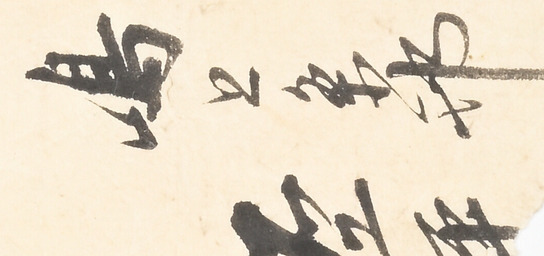嶋上条郡

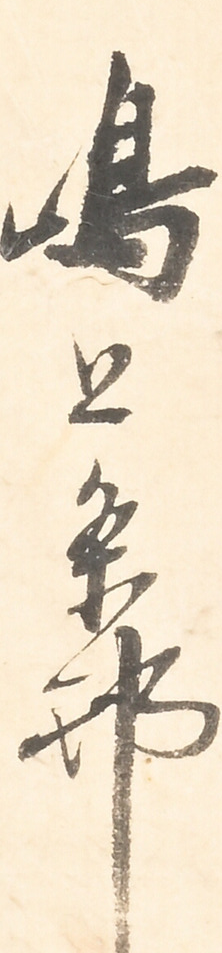嶋上条郡
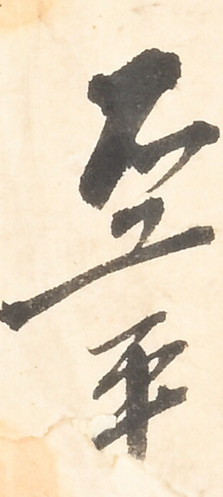石工平
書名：天保十二丑十月日御廟所石橋代金請取通
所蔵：伊那市立高遠町図書館・合同会社AMANE
